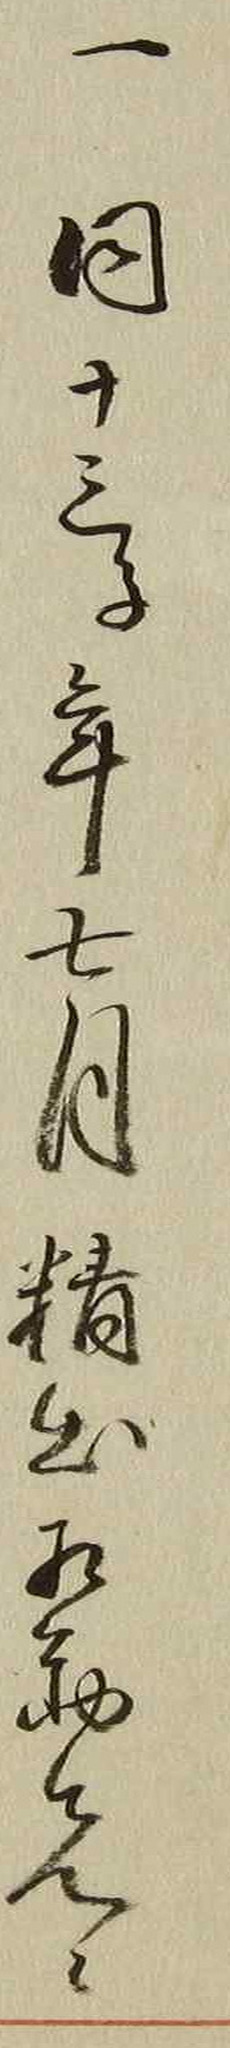一同十三子年七月精出相勤先々
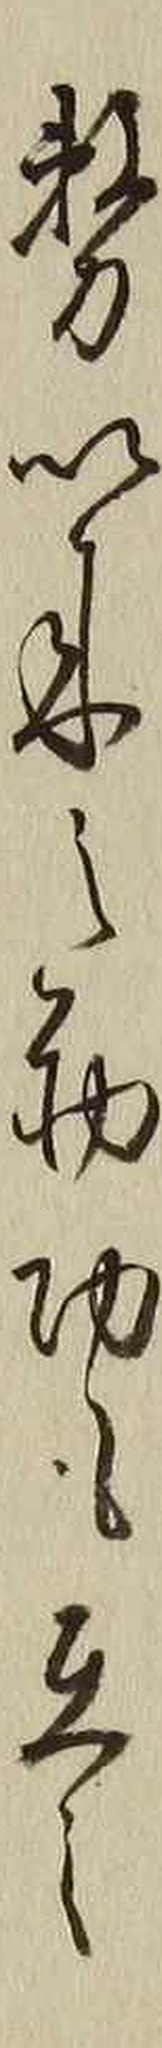務以来之勤功も在之
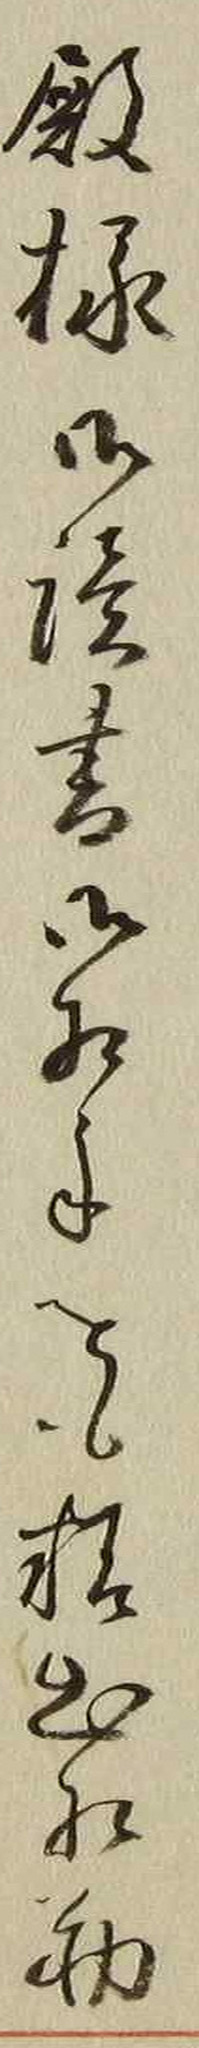殿様御読書御相手をも精出相勤
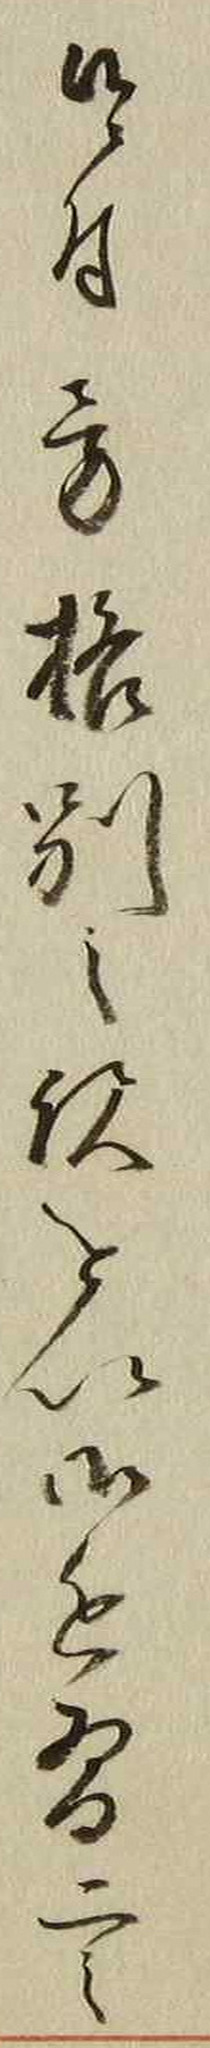候ニ付旁格別之訳を以御近習二之
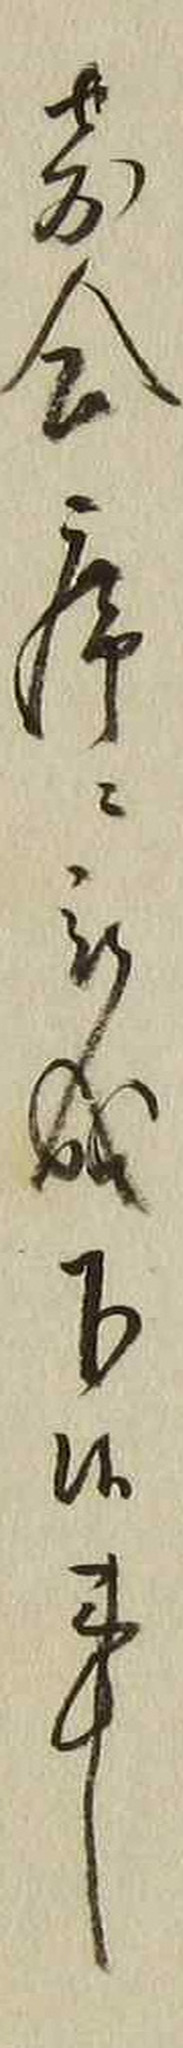寄合席ニ被成下候事
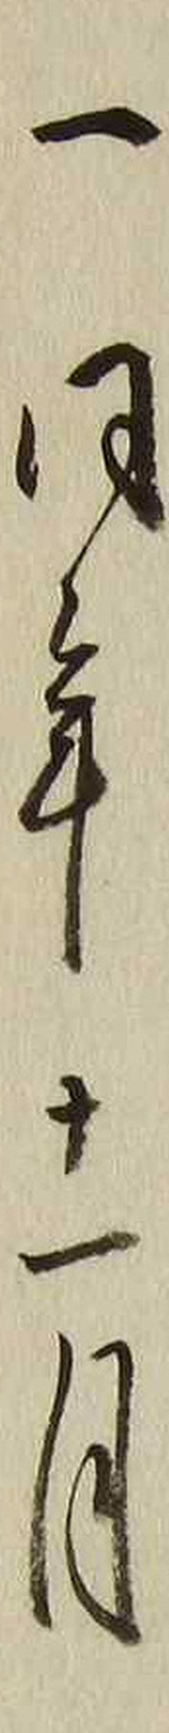一同年十一月
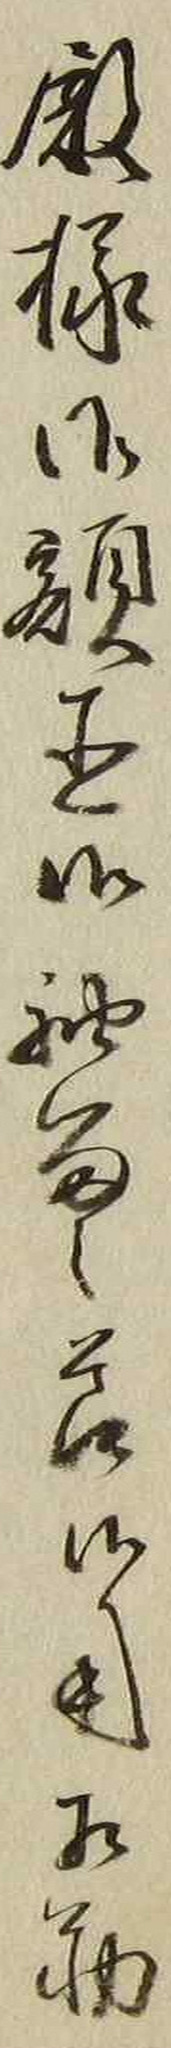殿様御額直御袖留之節御用相勤
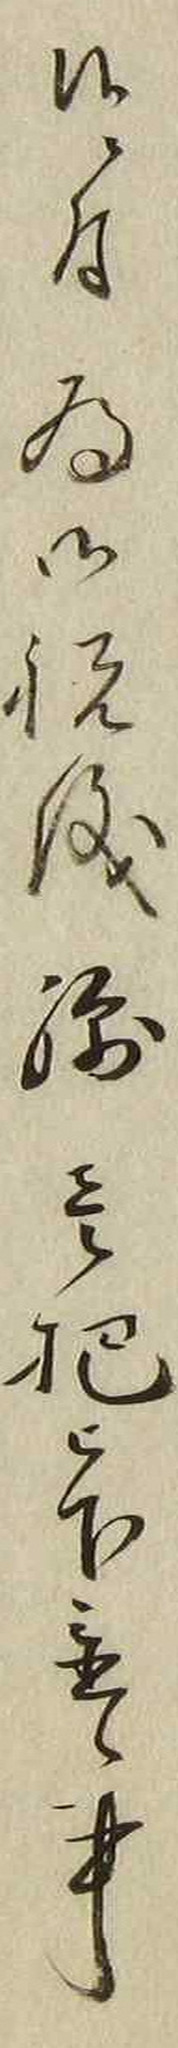候ニ付為御祝儀綿壱把被下置候事
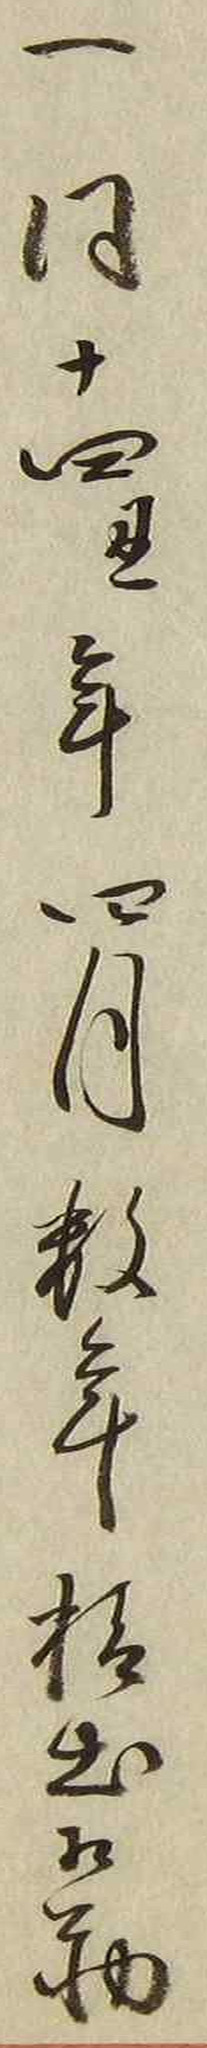一同十四丑年四月数年精出相勤
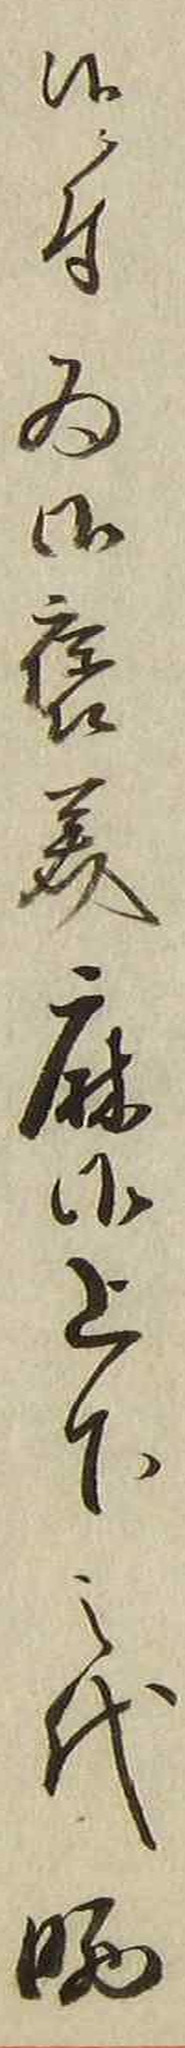候ニ付為御褒美麻御上下之代晒

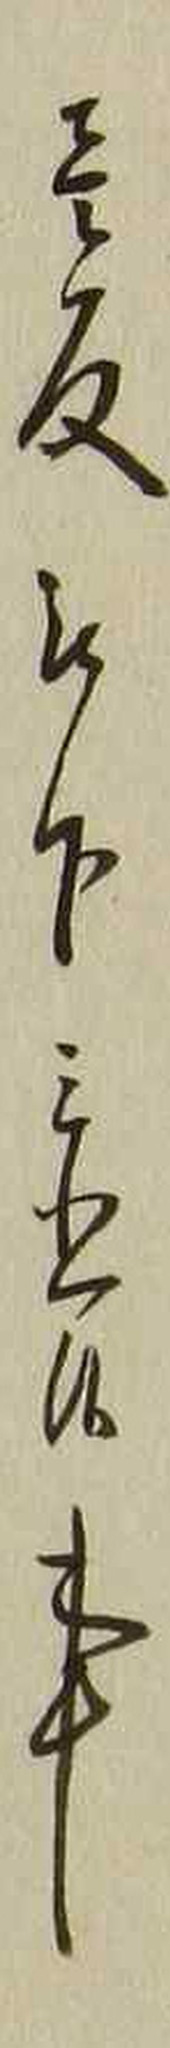壱反被下置候事
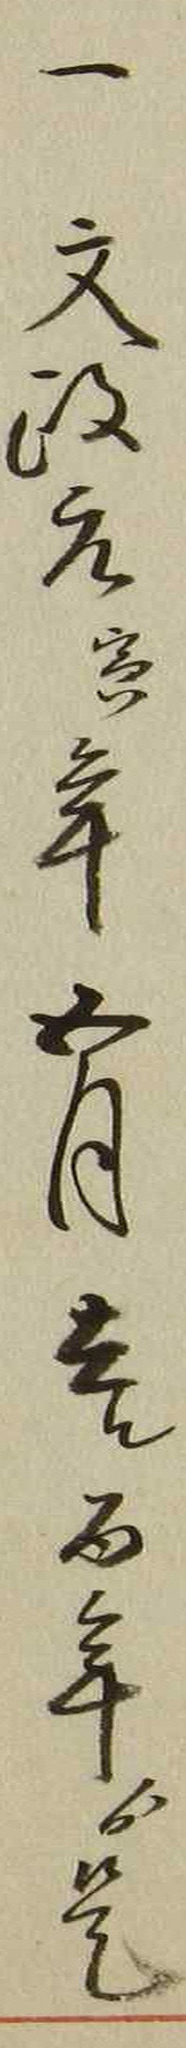一文政元寅年五月去ル酉年ゟ是
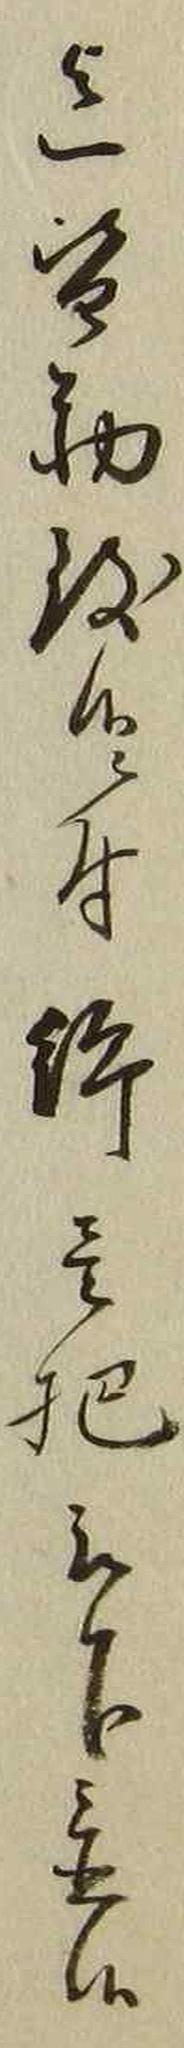迄皆勤致候ニ付綿壱把被下置候
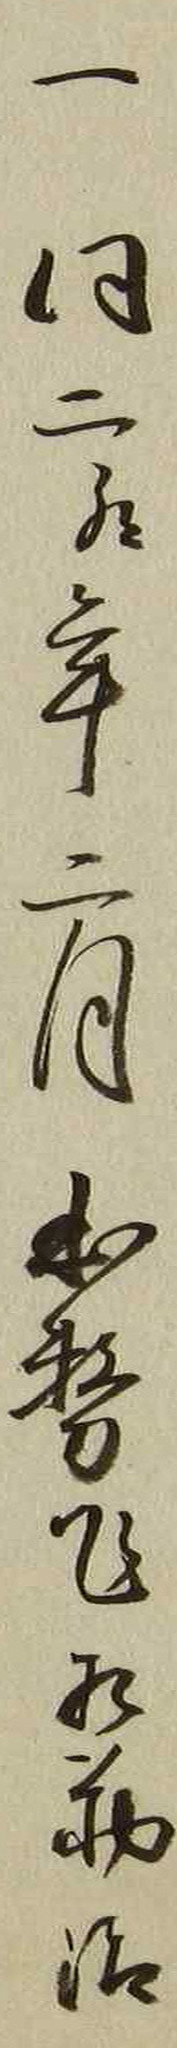一同二卯年二月本務乍相勤御
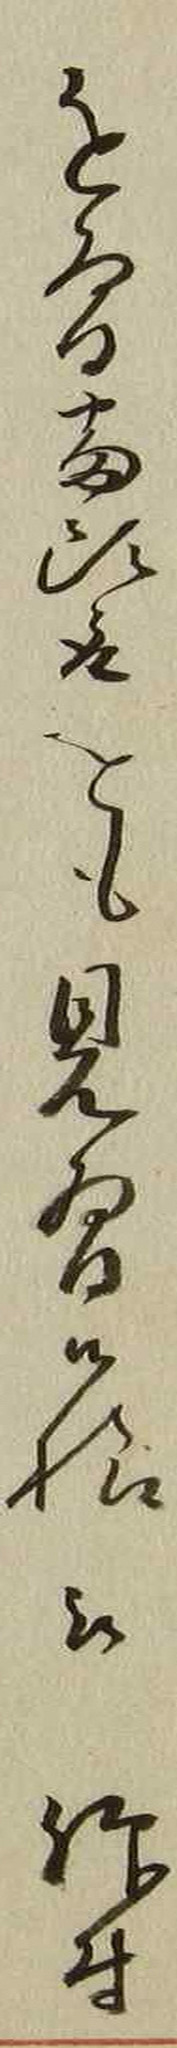近習番頭取をも見習候様被仰付
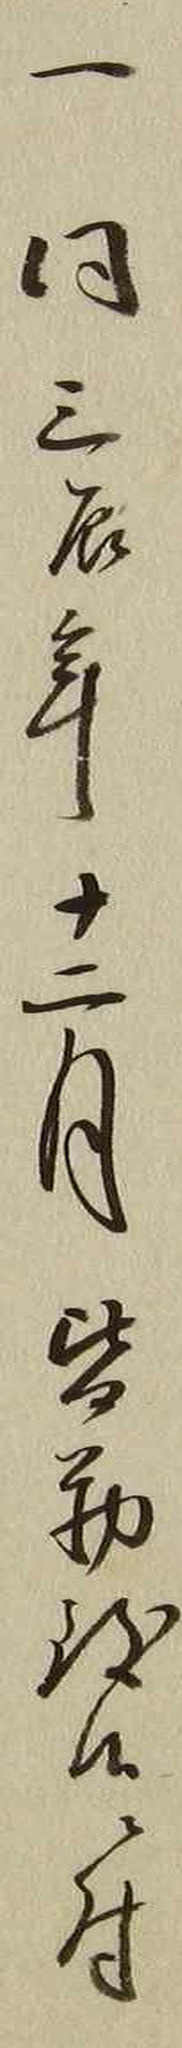一同三辰年十二月皆勤致候ニ付
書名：諸士系譜　巻之32　い之部32
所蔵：会津若松市立会津図書館
